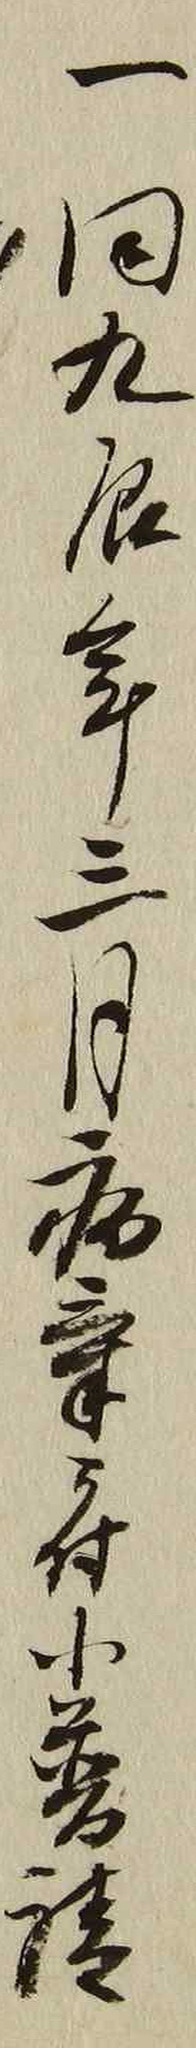一同九辰年三月病気ニ付小普請
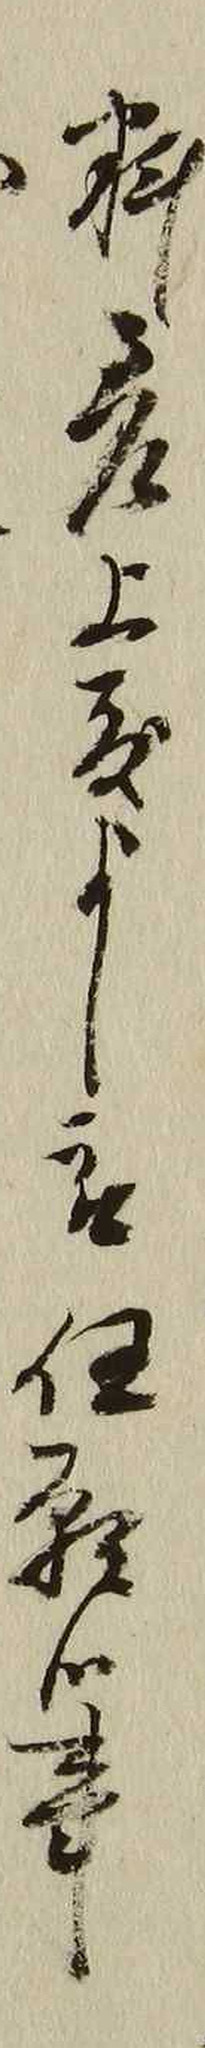料差上度よし被任願候事
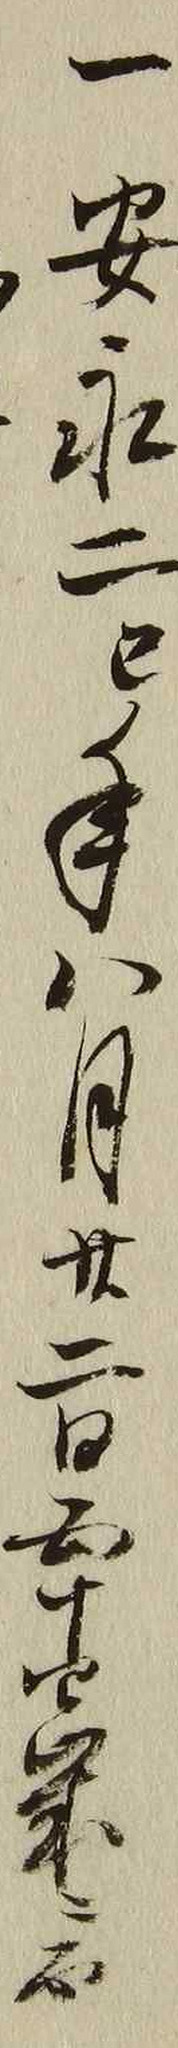一安永二巳年八月廿二日五十四歳ニ而
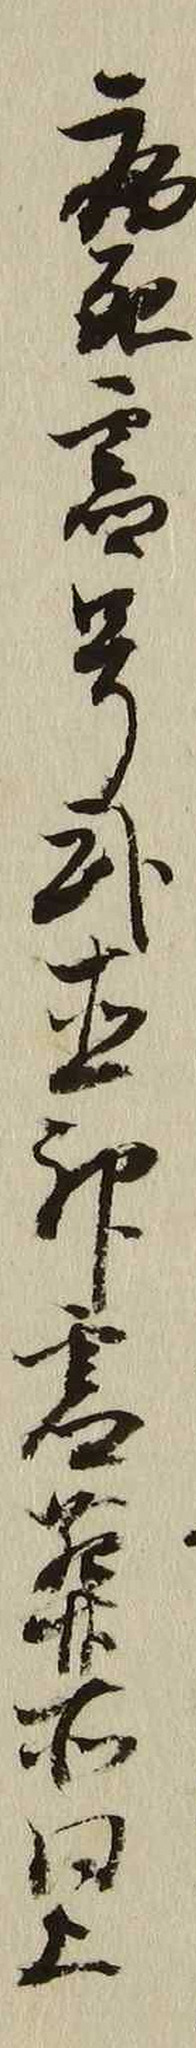病死霊号武直神霊葬所同上
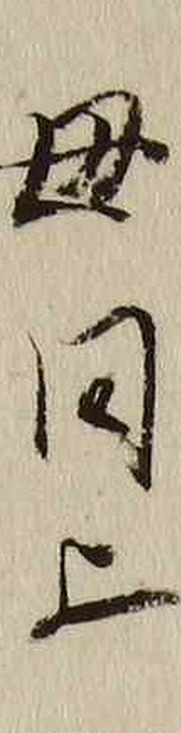母同上
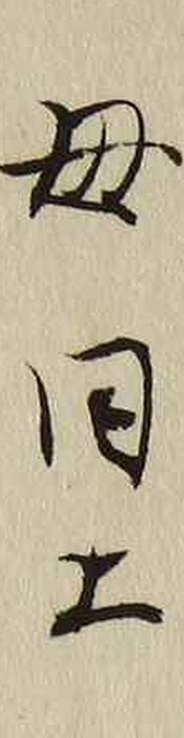母同上

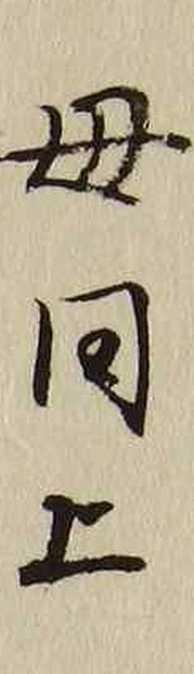母同上
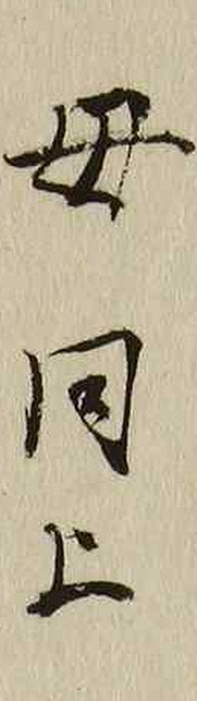母同上
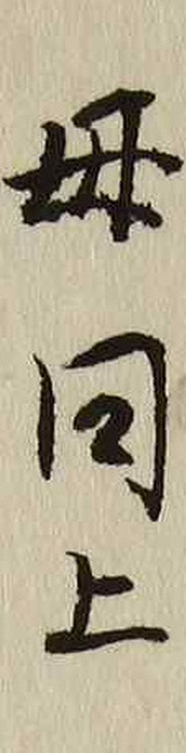母同上
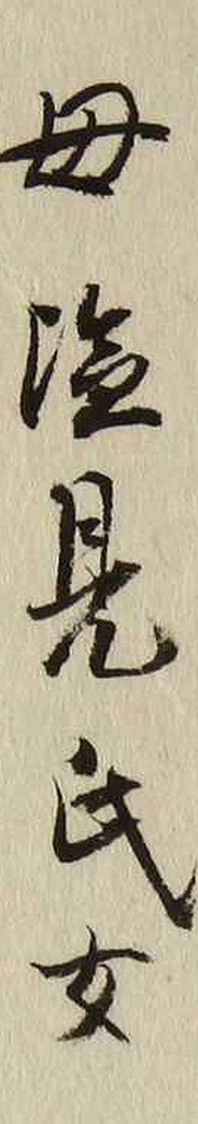母塩見氏女
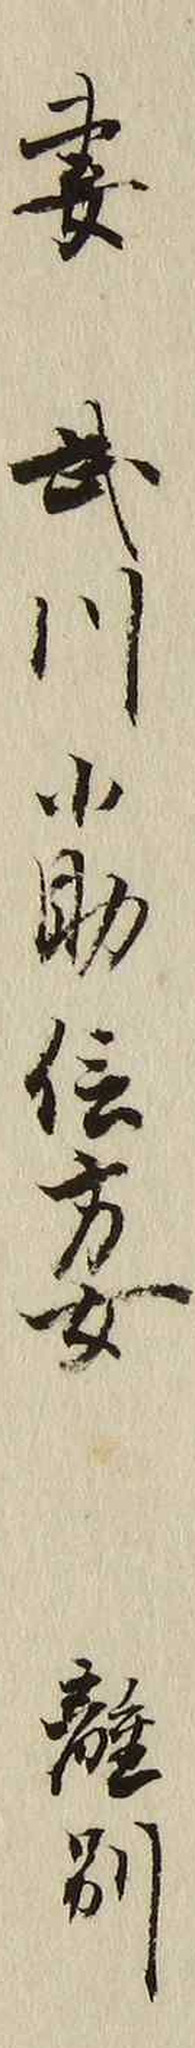妻武川小助信方女離別
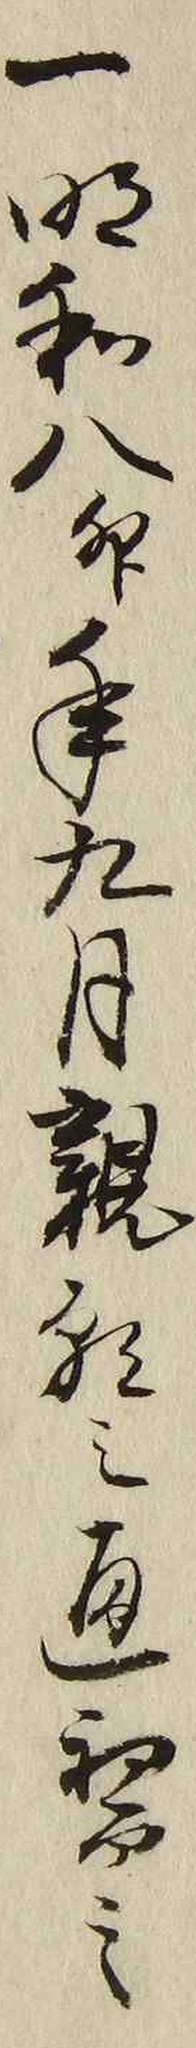一明和八卯年九月親願之通初而之
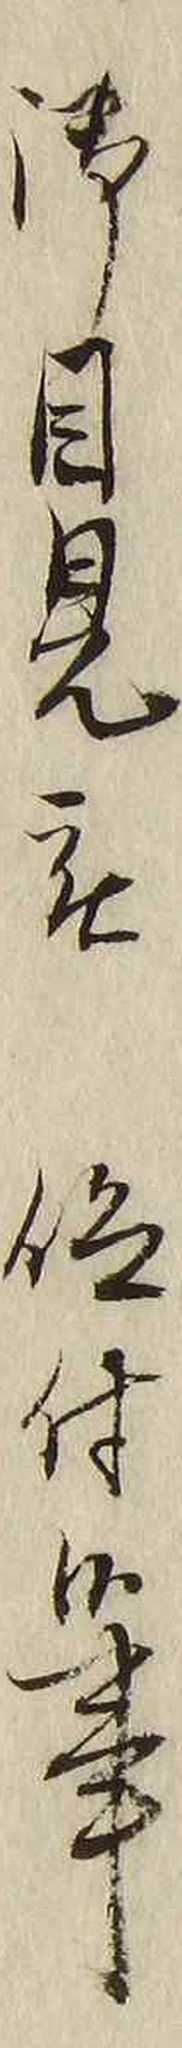御目見被仰付候事

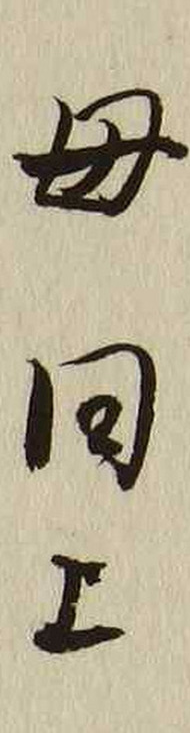母同上
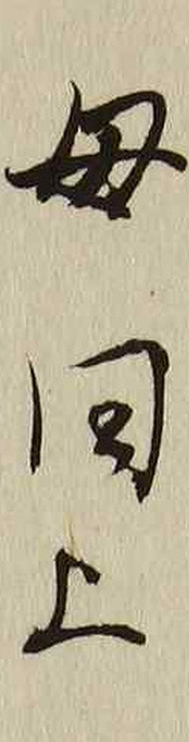母同上
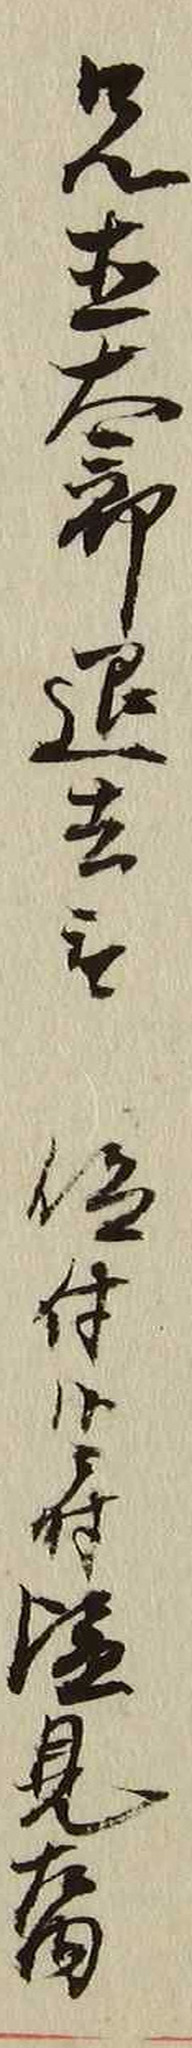兄直太郎退去被仰付候ニ付塩見左内
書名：諸士系譜　巻之349　も之部5
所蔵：会津若松市立会津図書館
